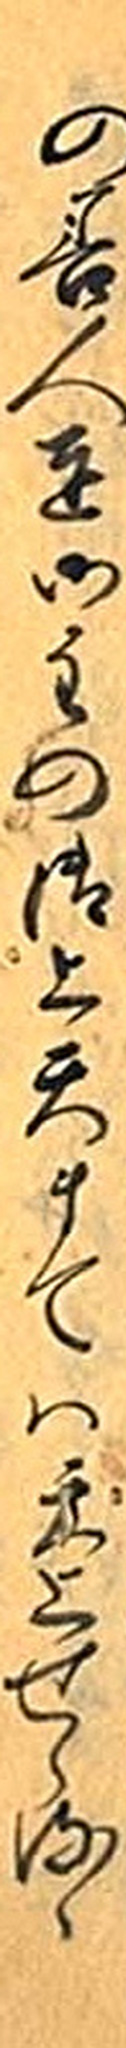の善人達御主の御上天まては上せらるゝ
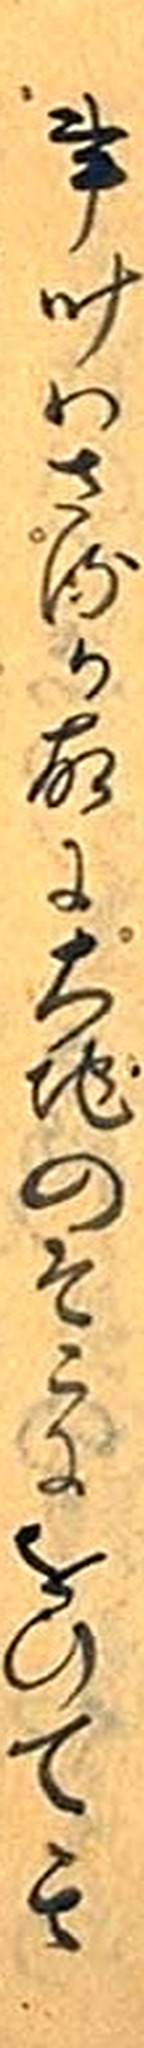事叶はさるか故に大地のそこにをひて其
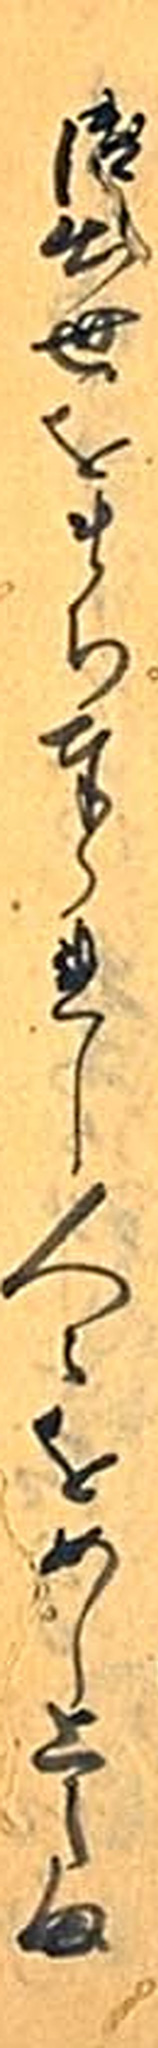御出世をまち奉られし人々をめし上たま
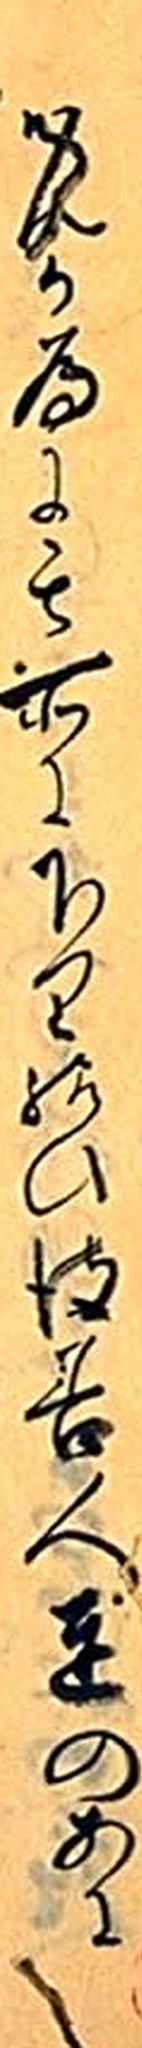はんか為に其所に下り給ひ彼善人達のあに
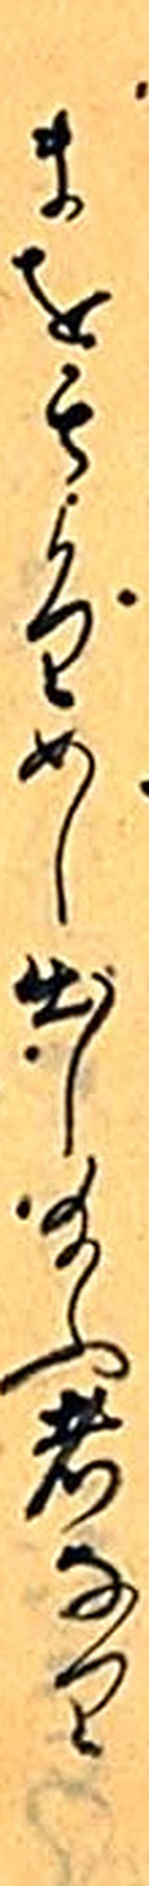まを其よりめし出し給ふ者なり
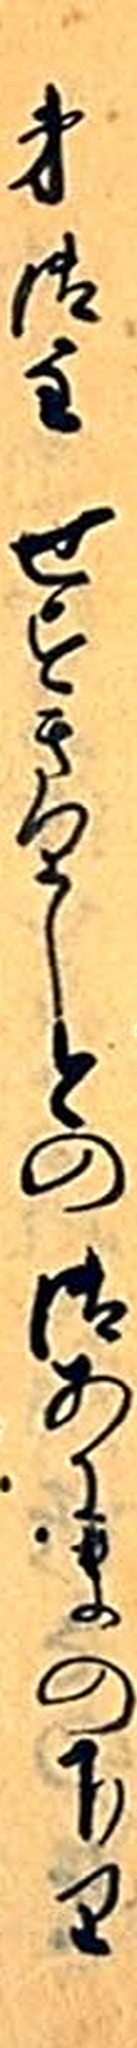弟御主せすきりしとの御あにまの下り
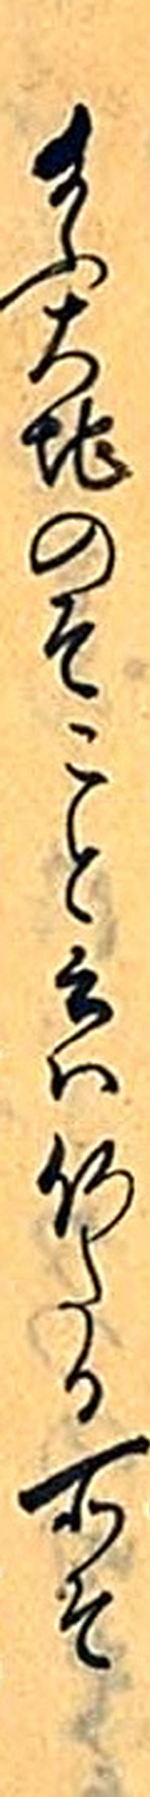給ふ大地のそこと云は何たる所そ
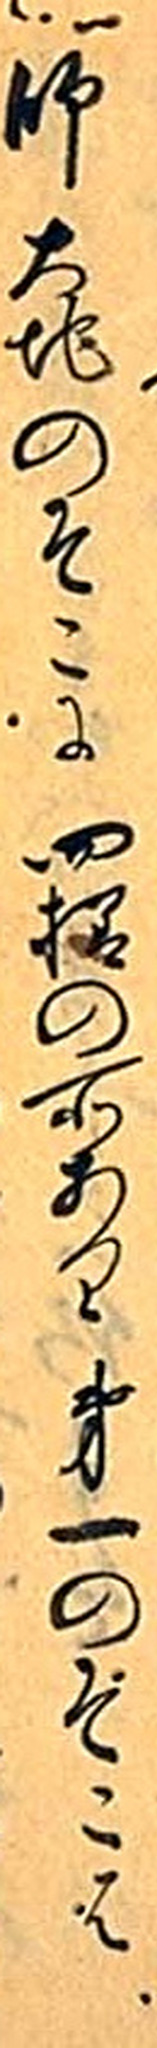師大地のそこに四様の所あり第一のそこは
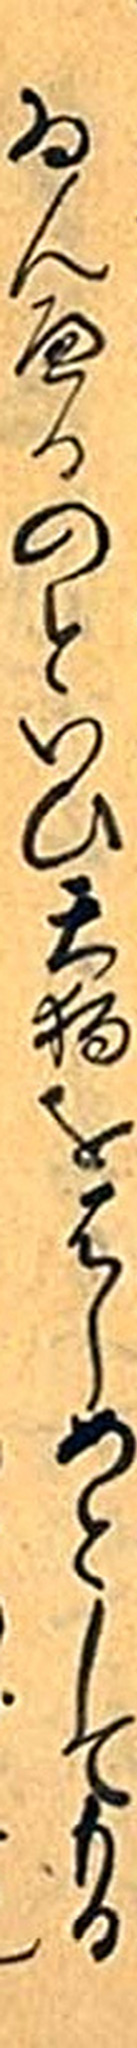ゐんへるのといひ天狗をはしめとしてもる
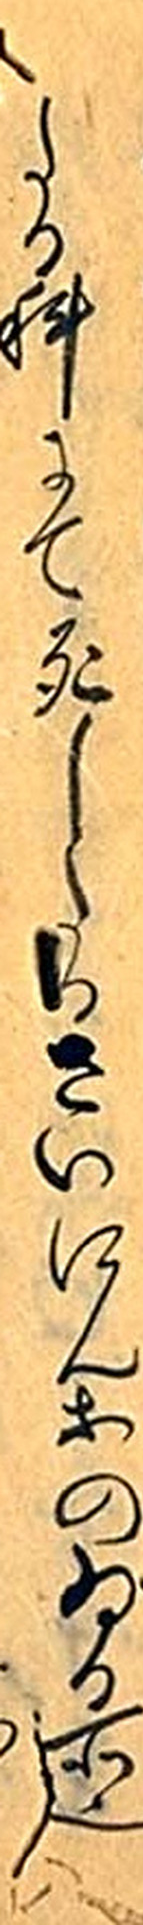たる科にて死したるさいにん等のゐる所也
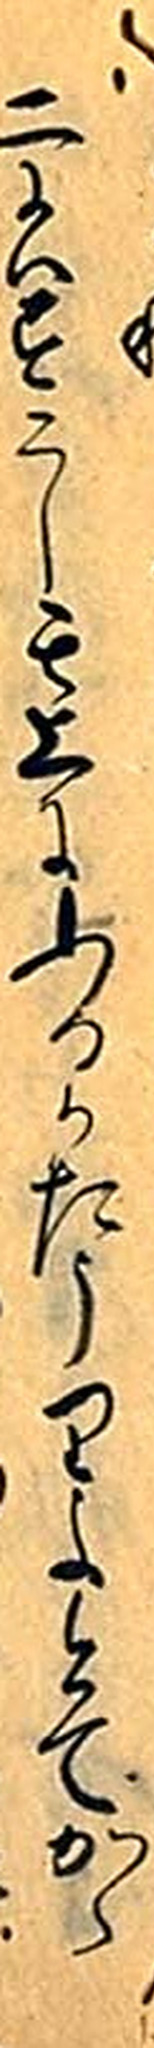二にはすこし其上にふるかたうりよとてから
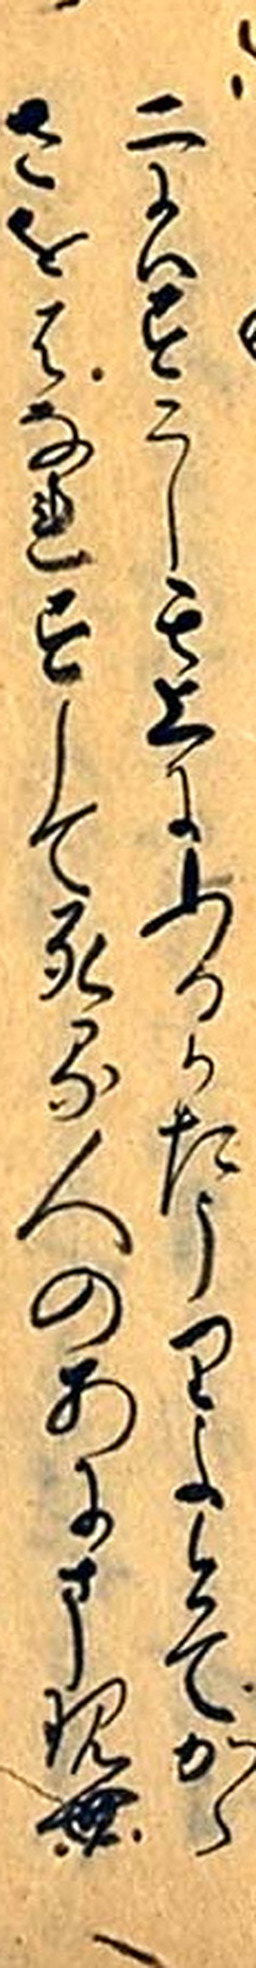さをはなれすして死る人のあにま現世
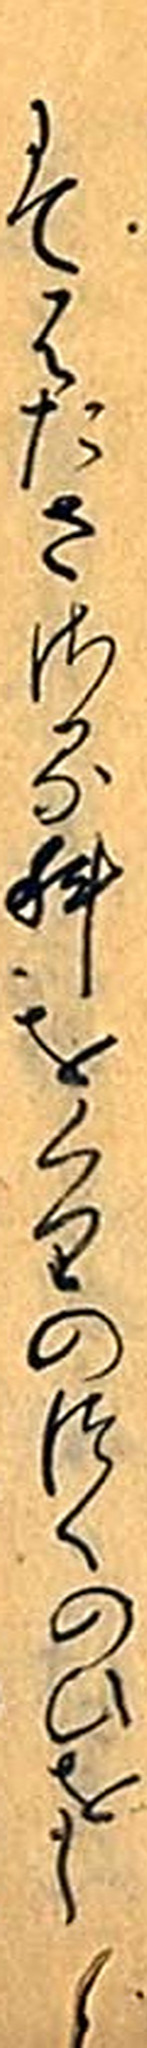にてはたささる科をくりのつくのひをし
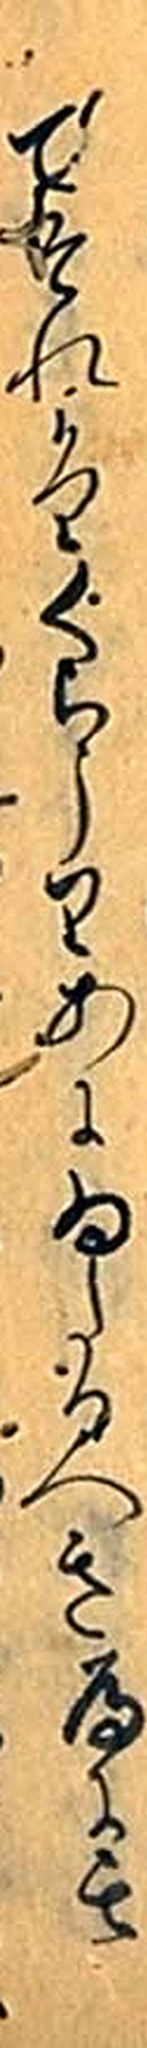てそれよりくらうりあにゐたるへき為に其

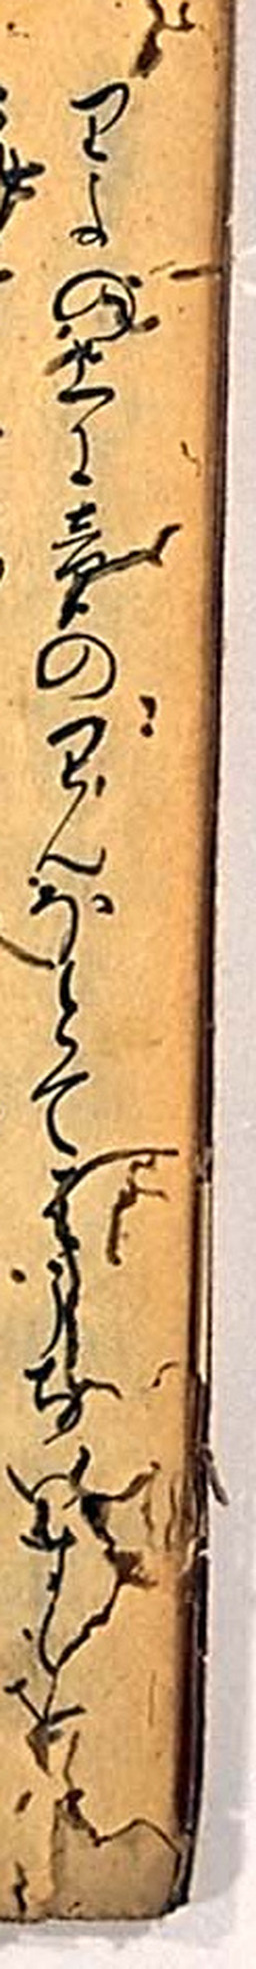りよの上に童のりんほとてはうちいすもを
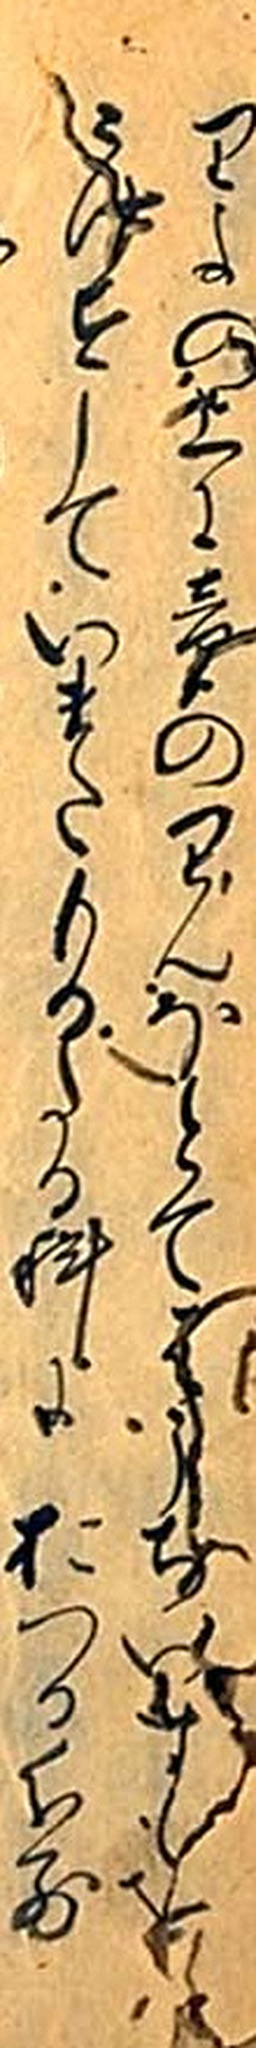うけすしていまたもるたる科におつる分別
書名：ドチリナ・キリシタン
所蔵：東京大学総合図書館 / General Library in the University of Tokyo
